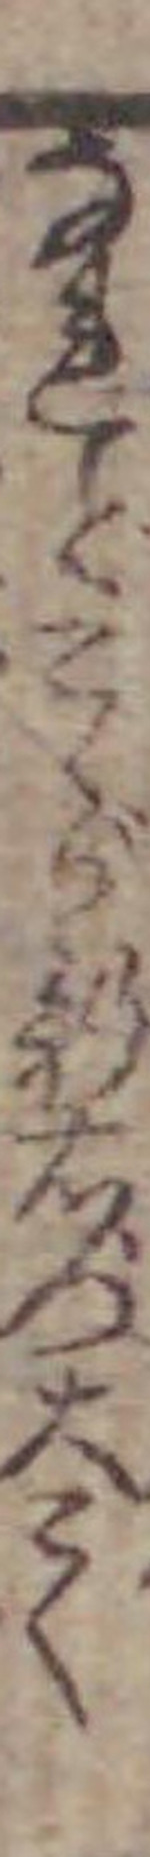なれとこゝが新右衛門大こく
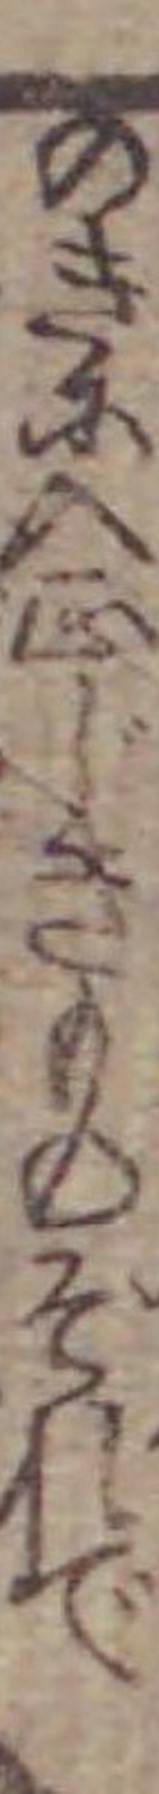のきに入正じきものそれで
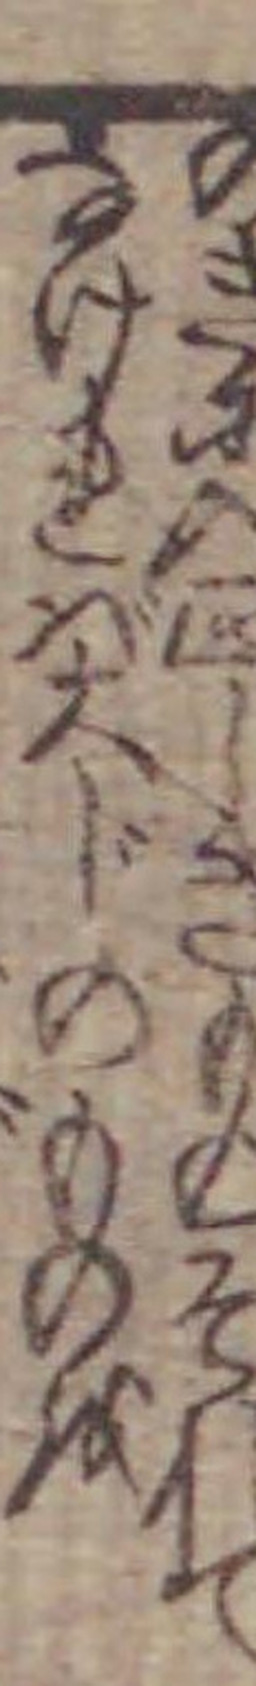なければ大じのものを
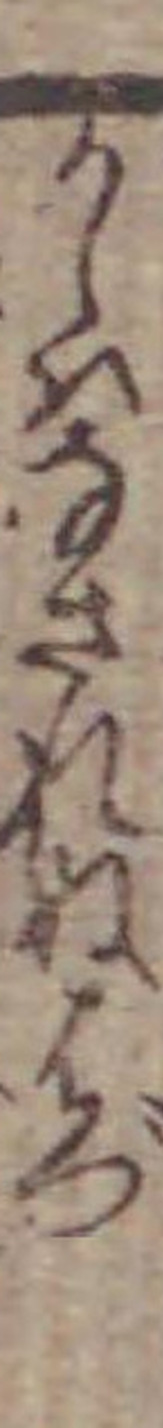かしはなされぬはづ
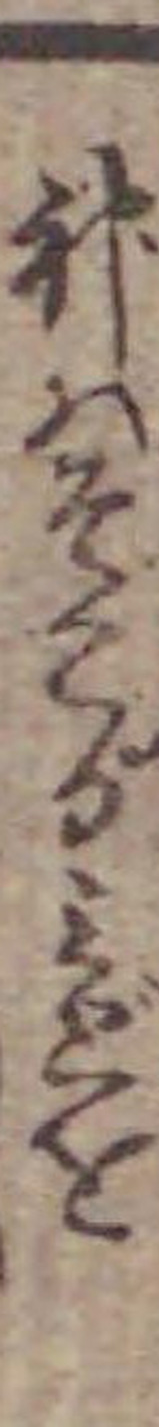神はそこがみどを
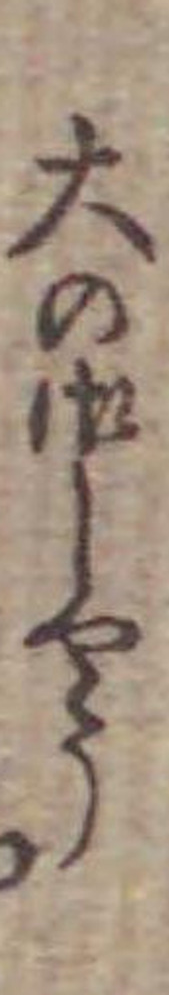大の御しやう

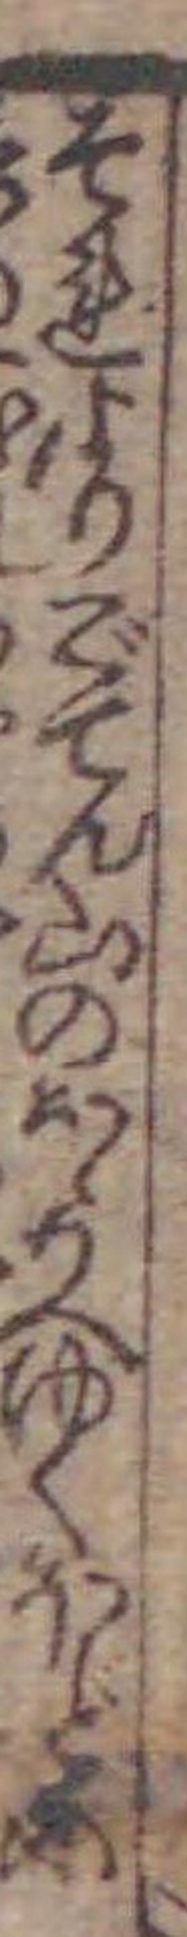それよりごてん山のほうへゆくほどに
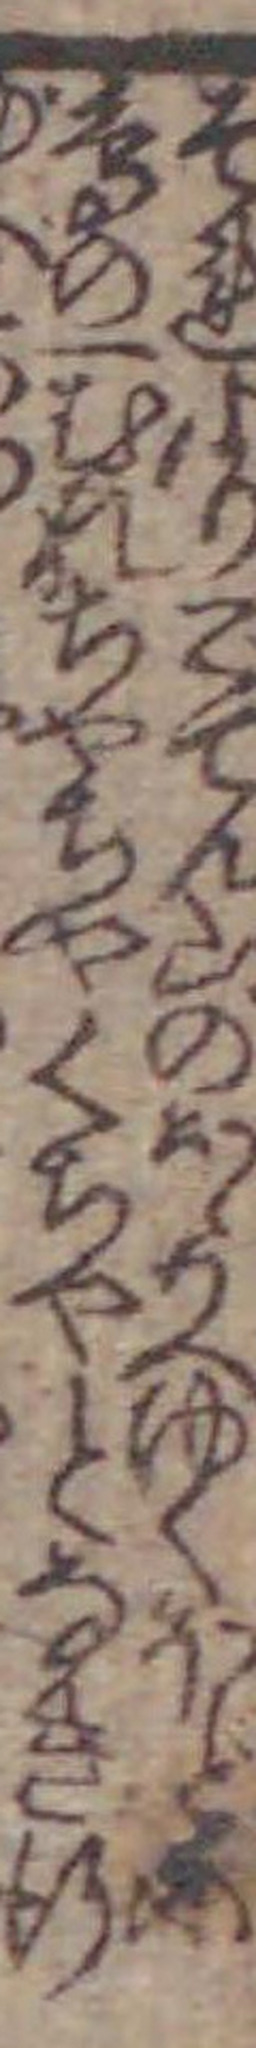鳥の一むれちやちやくちやとなき行
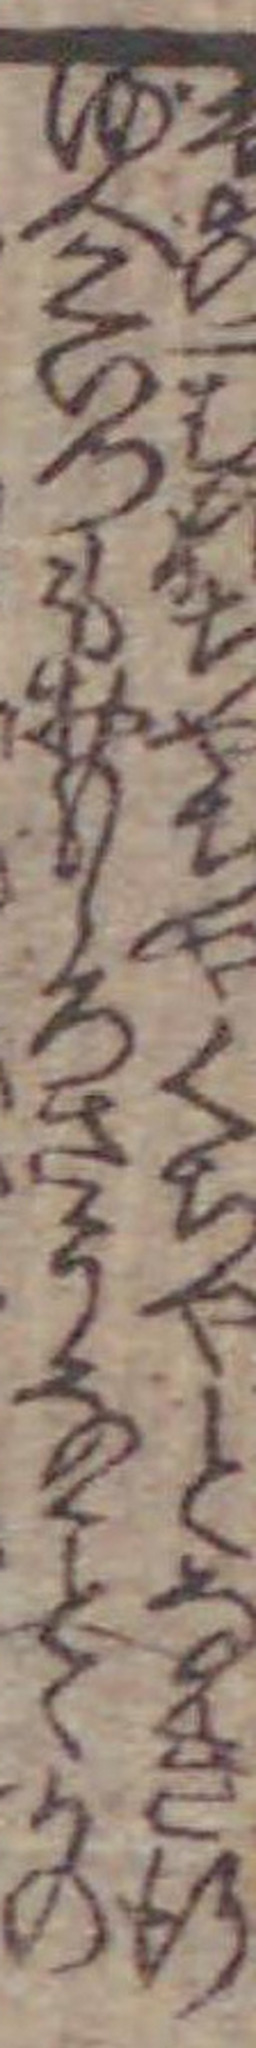ゆへこいつもおもしろさうなことゝかの
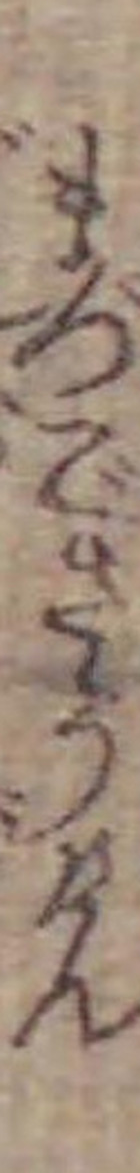まづごさうけん
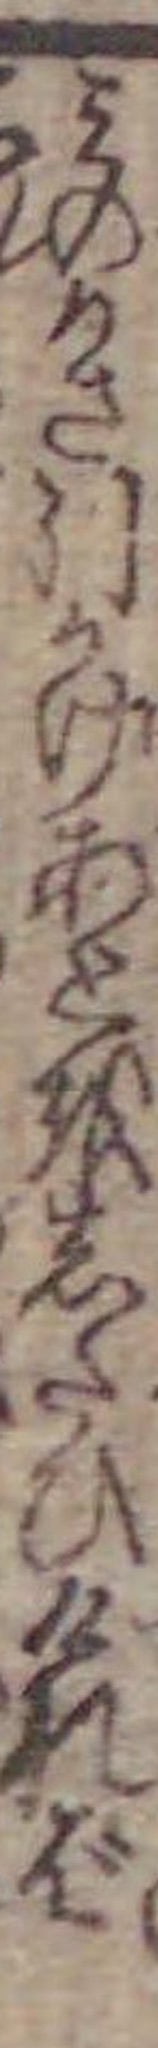みのかさ引かけあとをしたひければ
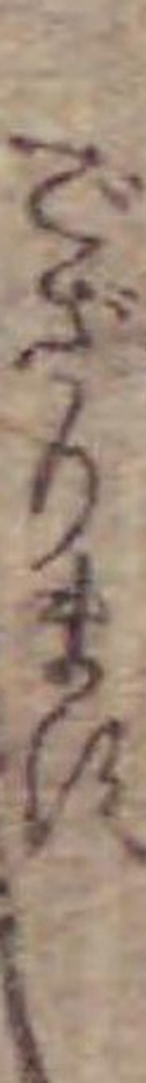ござります
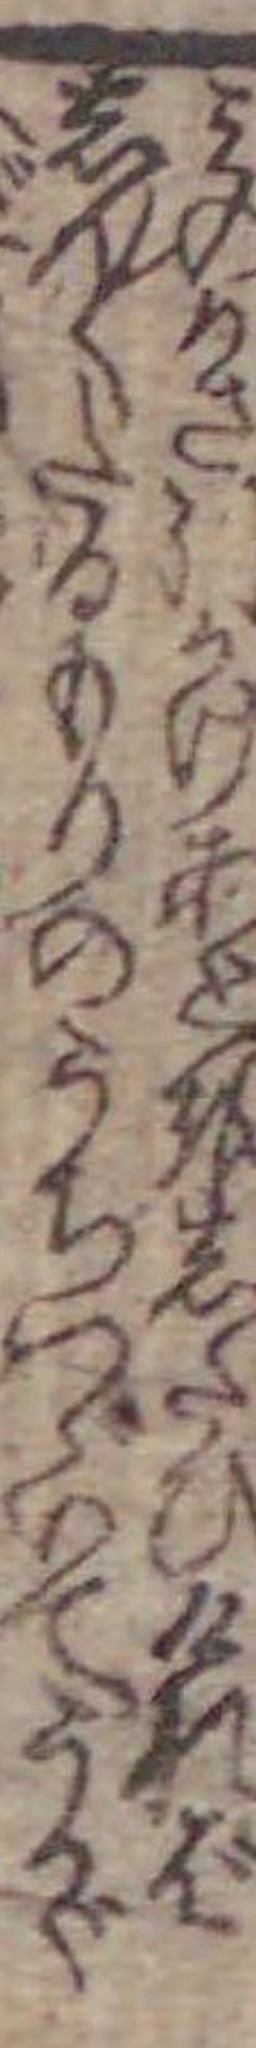しん〳〵たるもりのうちつゞいてうかゞ
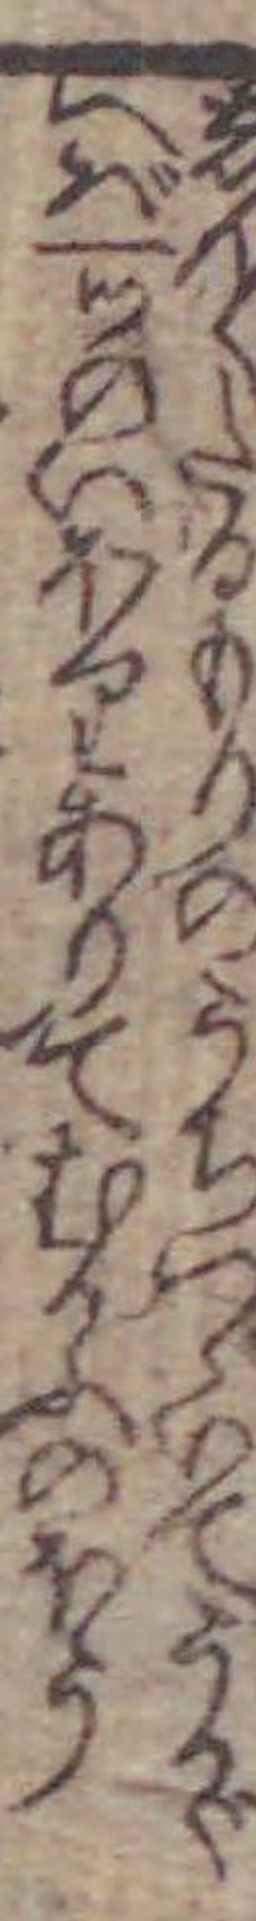へば一つのいほりありてむかふんほう
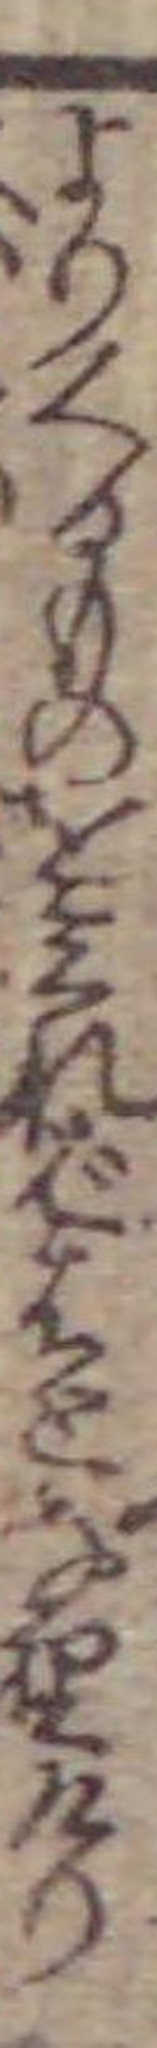よりくるものをみればはとなりけり
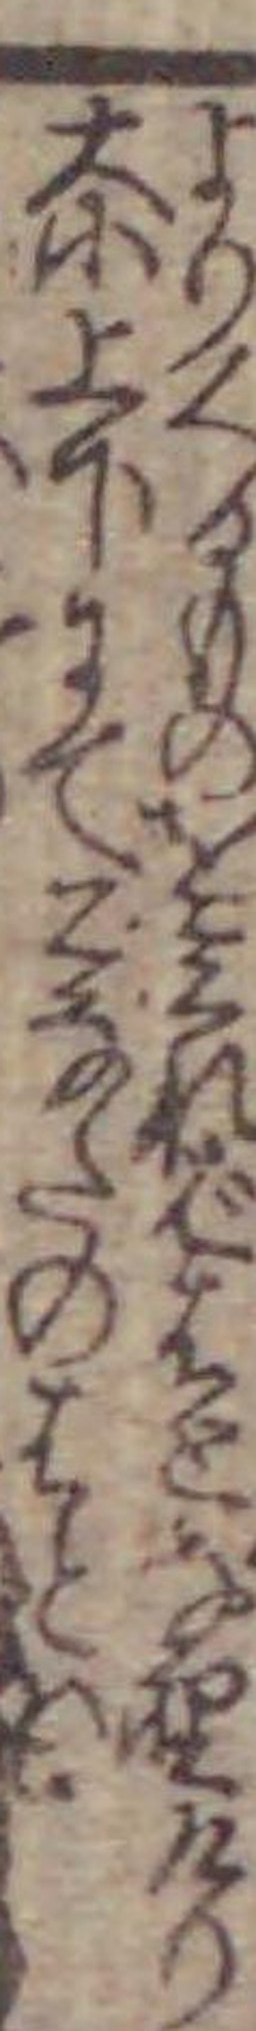大小上下にてこなたのはとは
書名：即席耳学問 : 3巻
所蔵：国立国会図書館 National Diet Library, JAPAN
